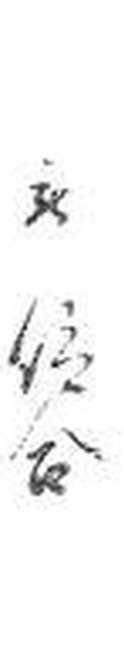被仰合
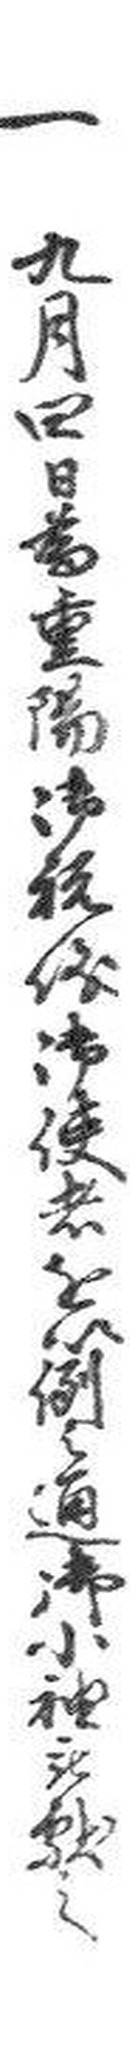一九月四日為重陽御祝儀御使者を以例之通御小袖被献之
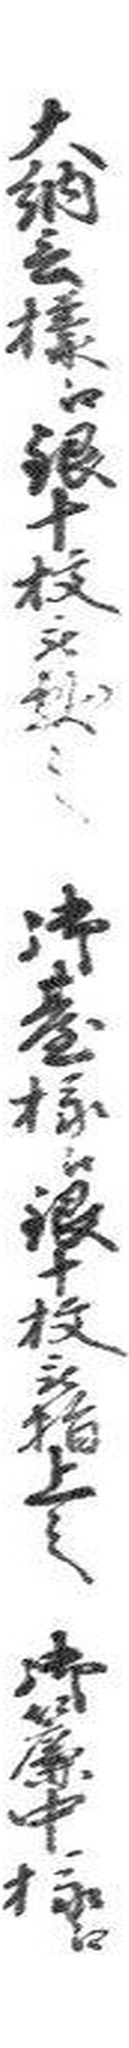大納言様江銀十枚被献之御台様江銀十枚被指上之御簾中様江
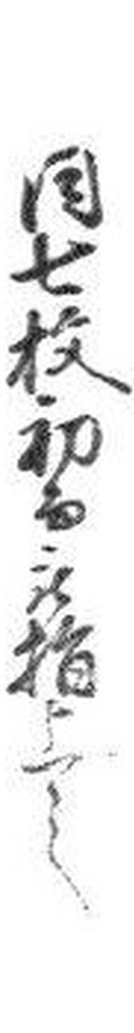同七枚初而被指上之
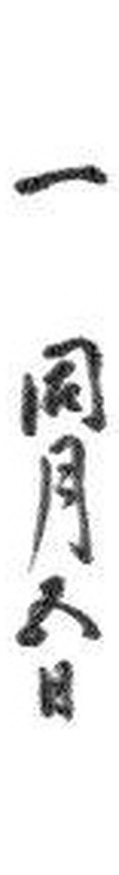一同月五日
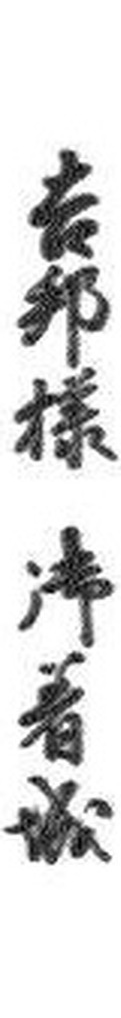吉邦様御着城
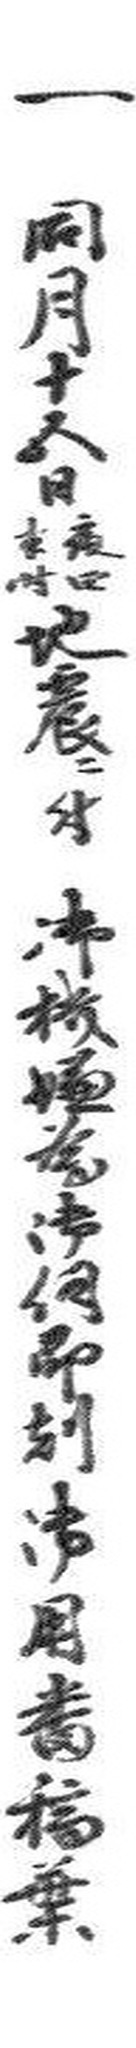一同月十五日夜四半時地震ニ付御機嫌為御伺即刻御用番稲葉
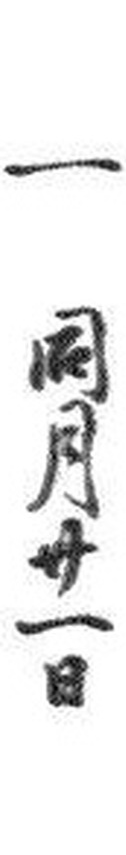一同月廿一日
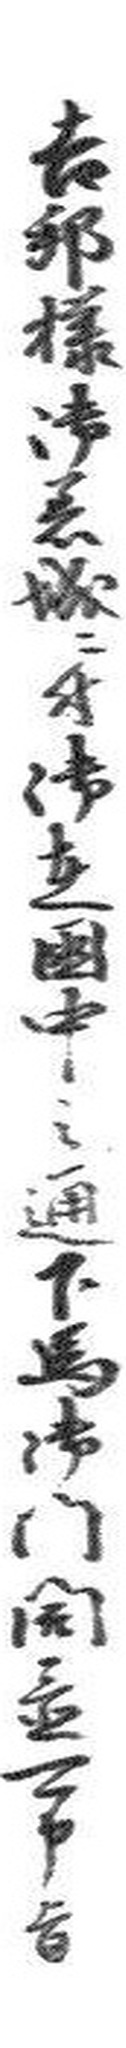吉邦様御着城ニ付御在国中之通下馬御門開置可申旨
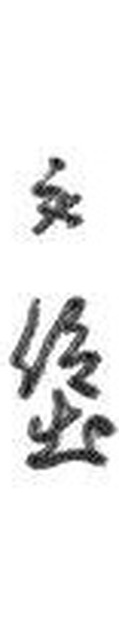被仰出
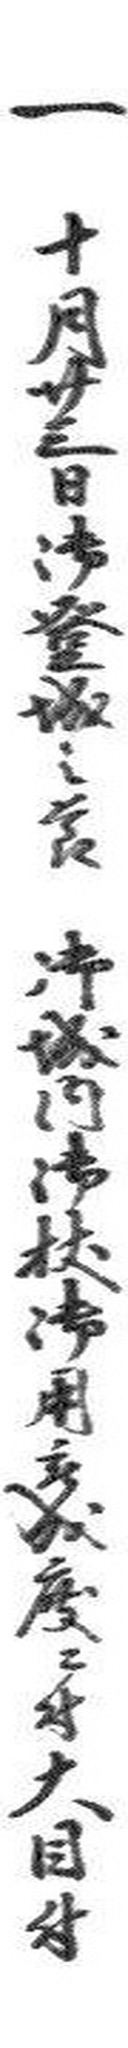一十月廿三日御登城之節御城内御杖御用被成度ニ付大目付
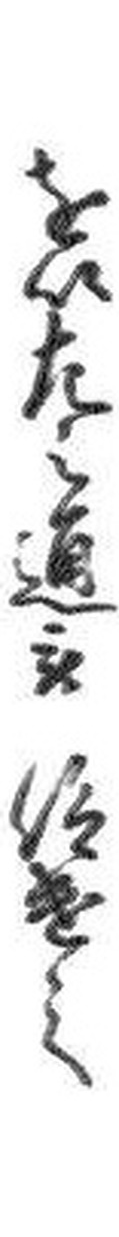を以左之通被仰遣之

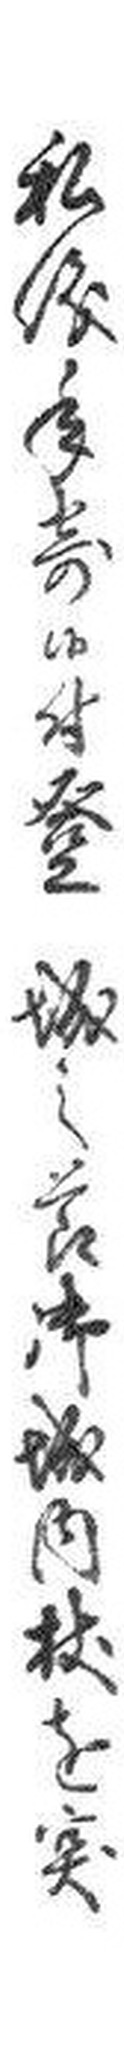私儀年寄候付登城之節御城内杖を突
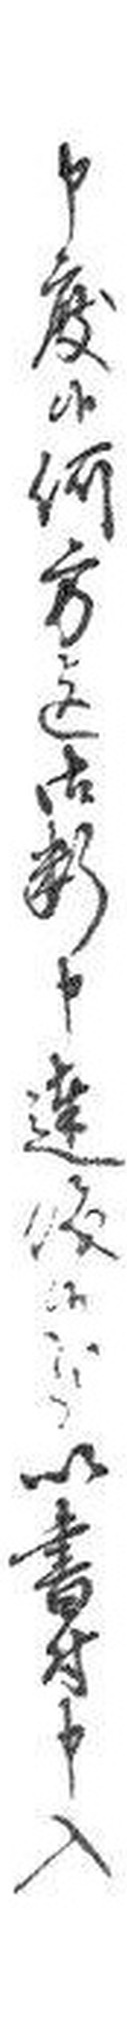申度候何方迄御断申達儀候哉を以書付申入
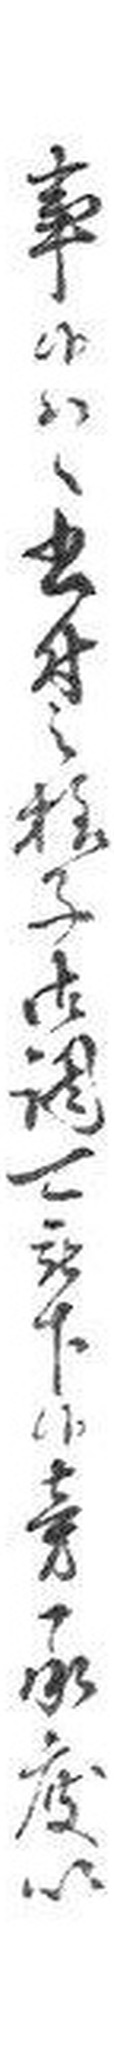事候ハヽ書付之様子御調可被下候旁承度以
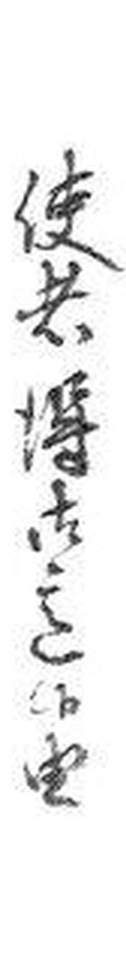使者得御意候由
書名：家譜 二十四 吉品公 従宝永三年到同五年
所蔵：福井県文書館 Fukui Prefectural Archives
